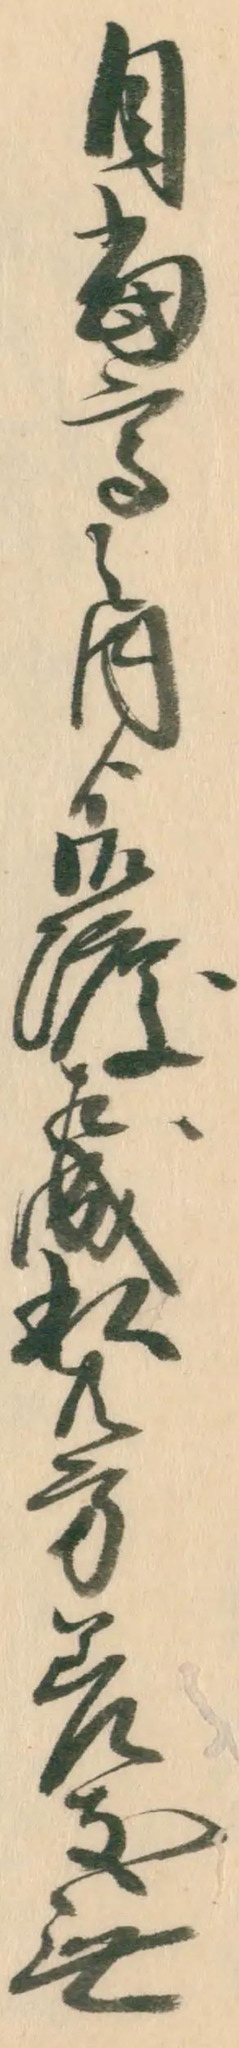目当高之内ゟ御渡相成私共方差支無
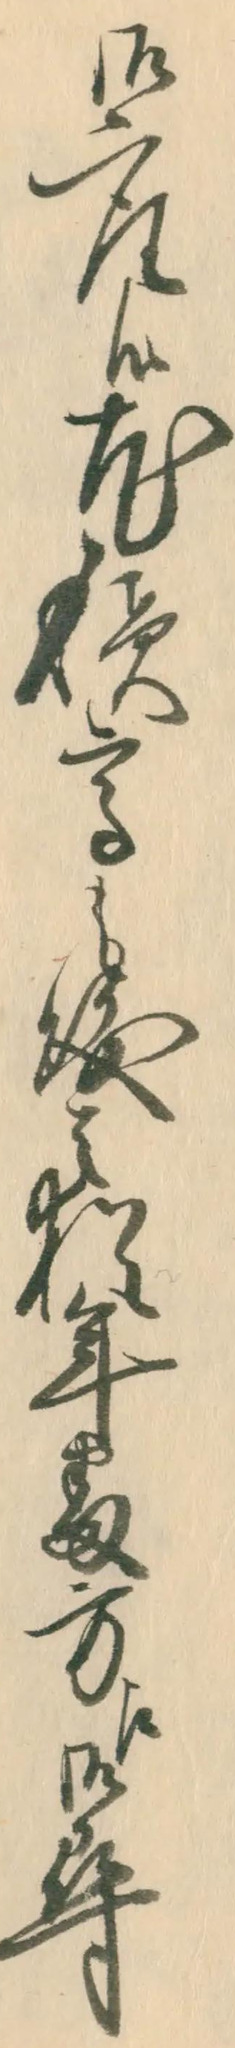御座候尤積高之儀は猶年番え御尋
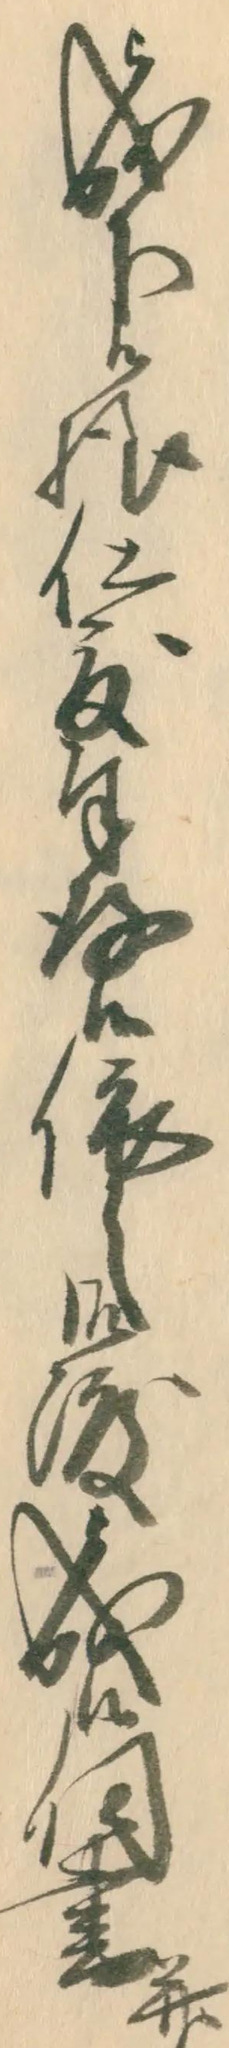被成下候様仕度奉存候依之御渡被成伺書并

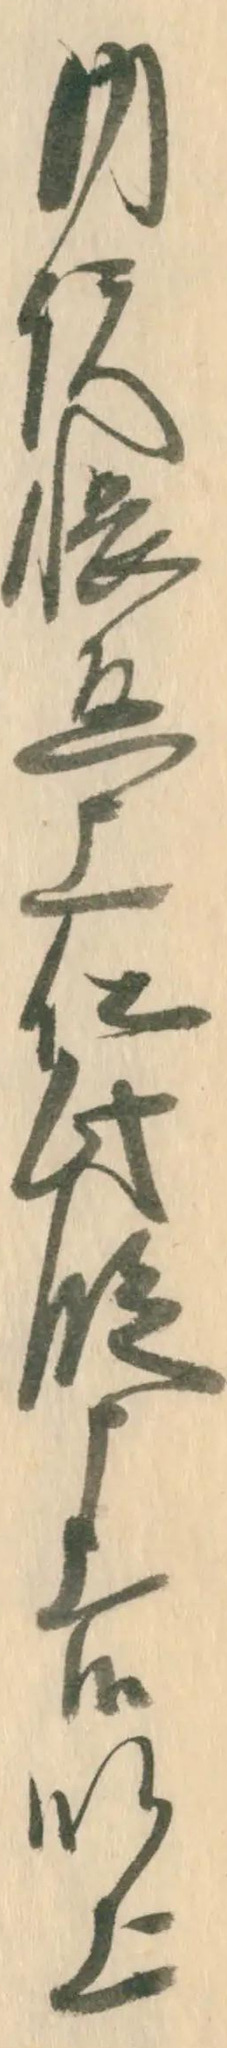内訳帳返上仕此段申上候以上
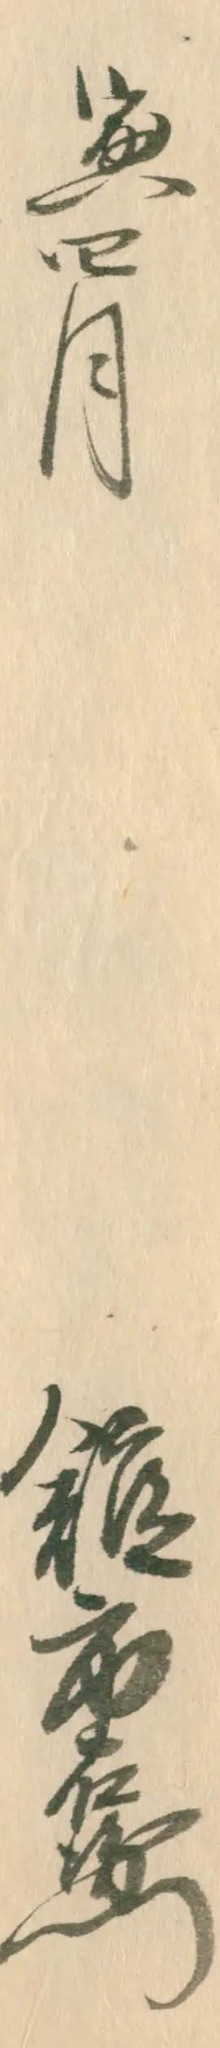寅四月館市右衛門
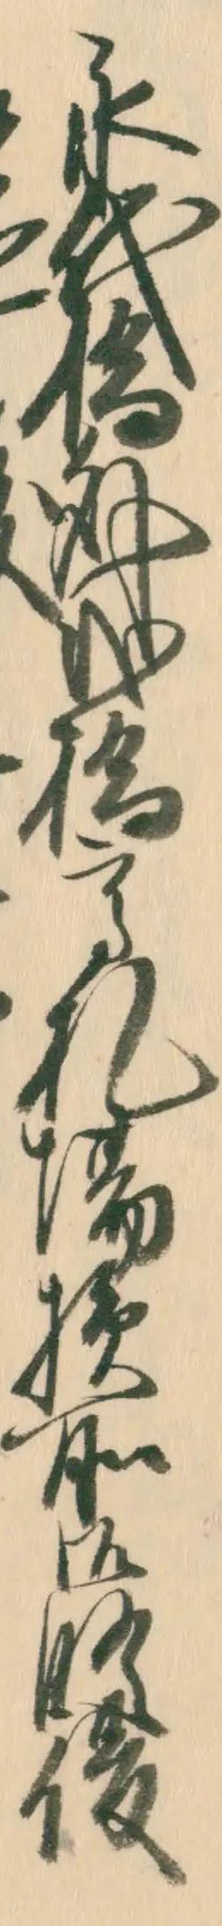永代橋外弐橋高札場損所御修復
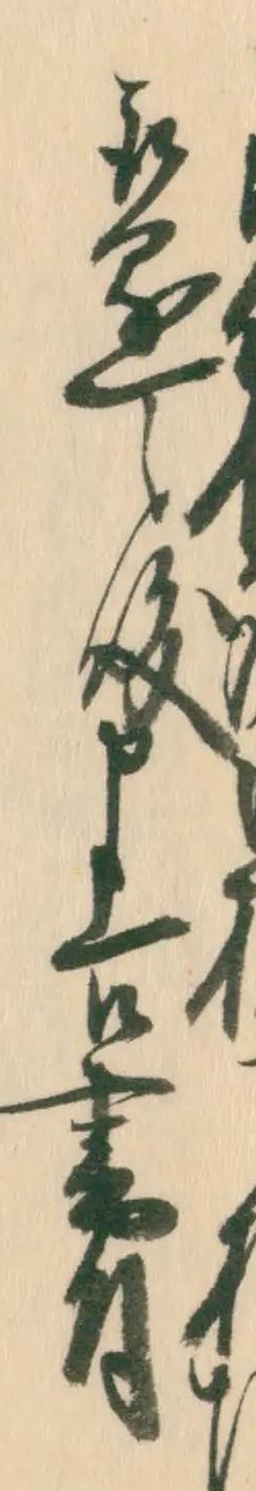取懸之儀申上候書付
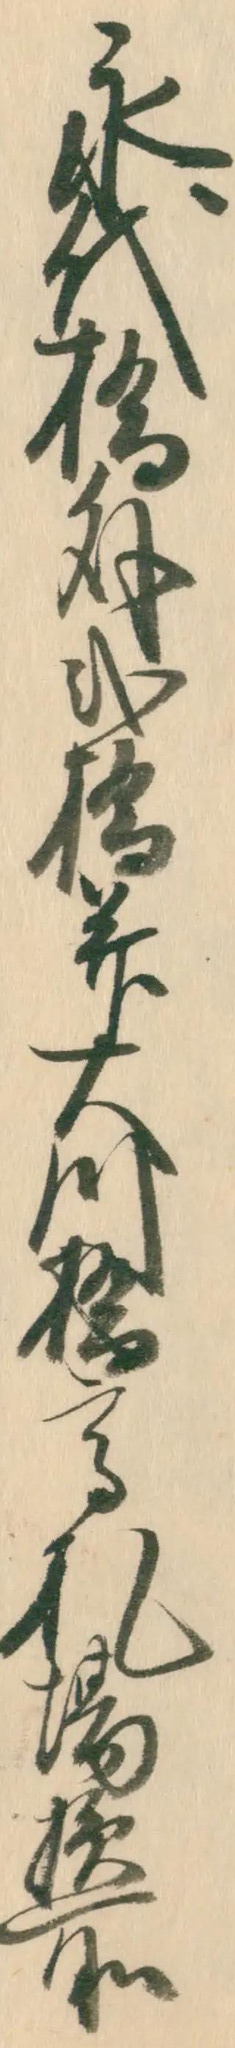永代橋外弐橋并大川橋高札場損所
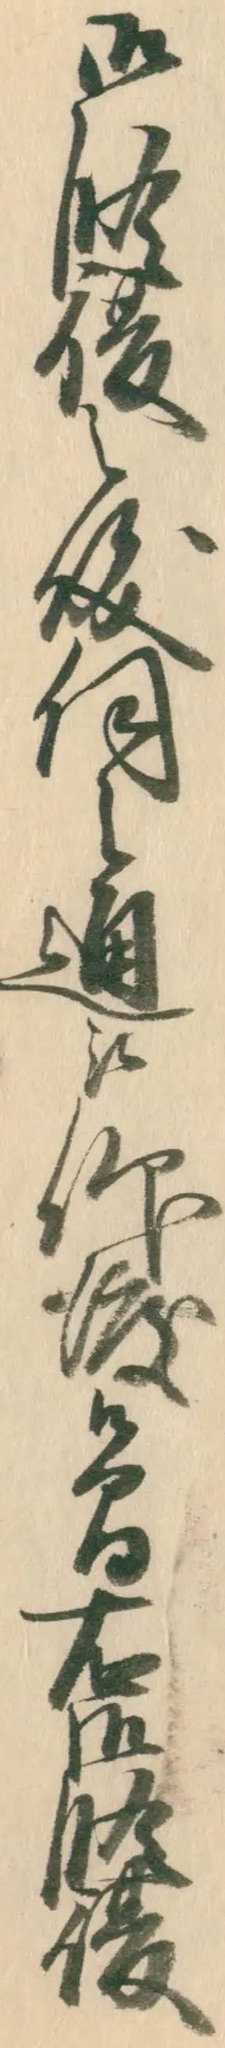御修復之儀伺之通被仰渡候間右御修復
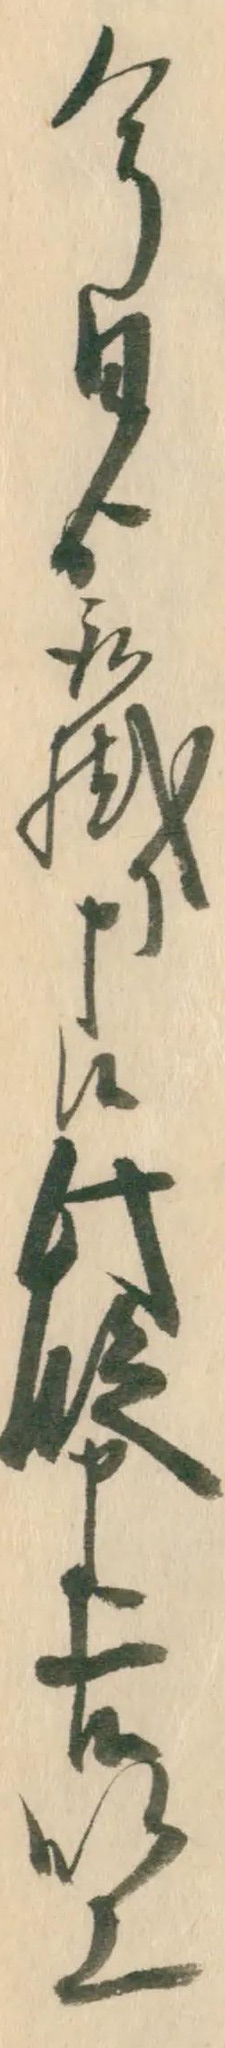今日ゟ取掛り申候此段申上候以上

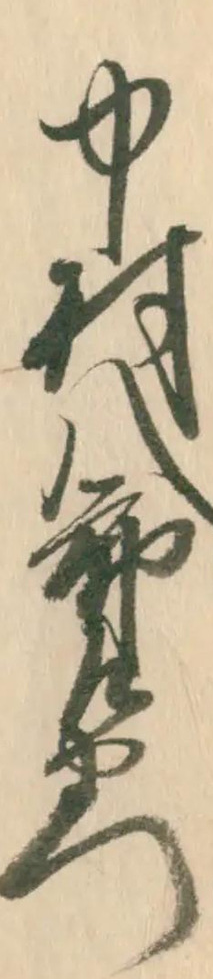中村八郎右衛門
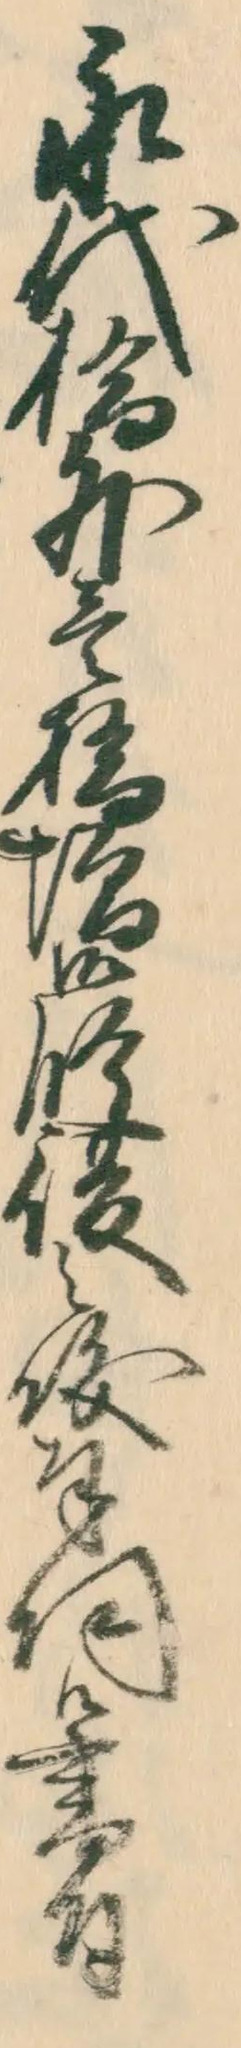永代橋外壱橋増御修復之儀奉伺候書付
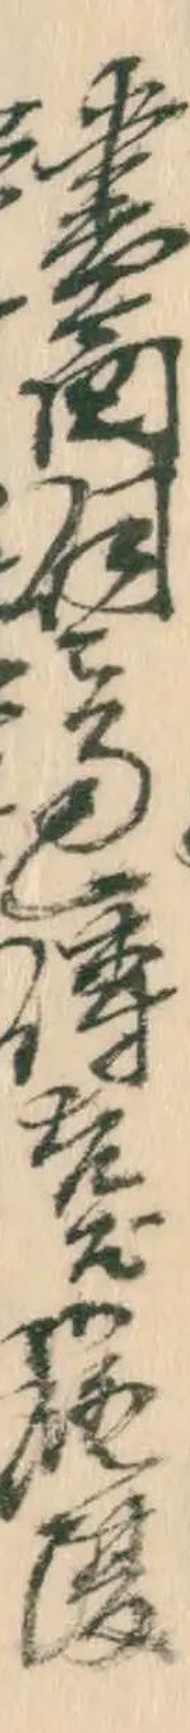書面伺之通伝吉え御修復
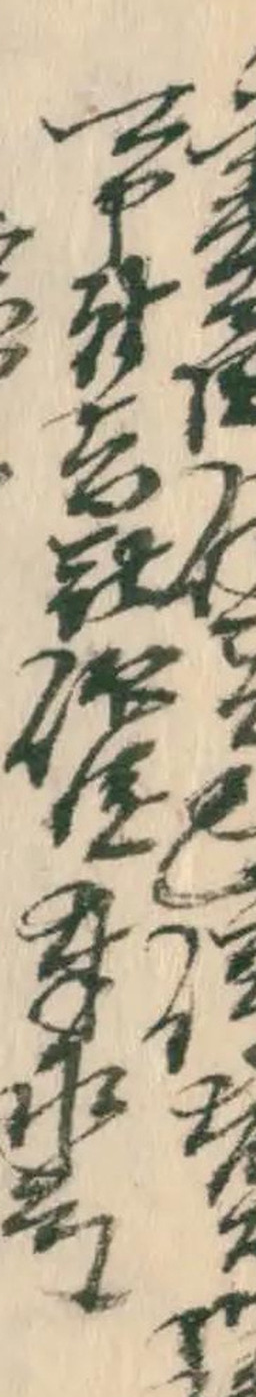可申付旨被仰渡奉承知候
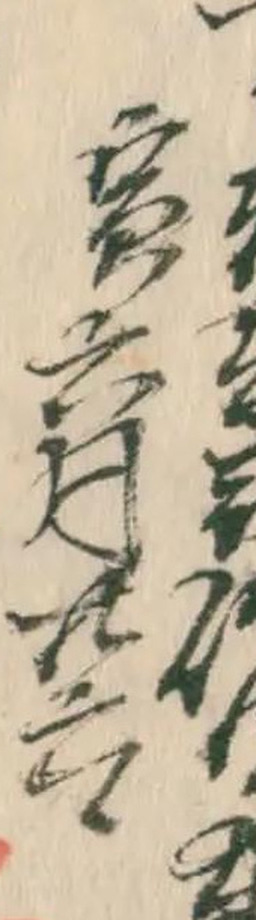寅六月廿六日
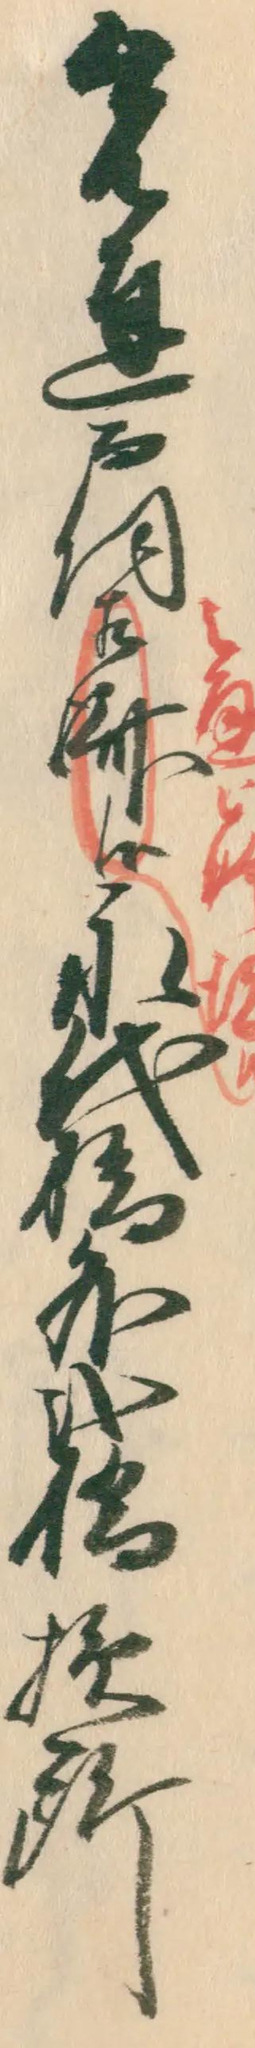先達而伺「相済候」永代橋外弐橋損所
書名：三橋 17巻. [8] 三橋小破御修復書留　但御奉行御掛リ替地震潰橋番屋　嘉永四亥年より安政二卯年迄　下
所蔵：国立国会図書館 National Diet Library, JAPAN
